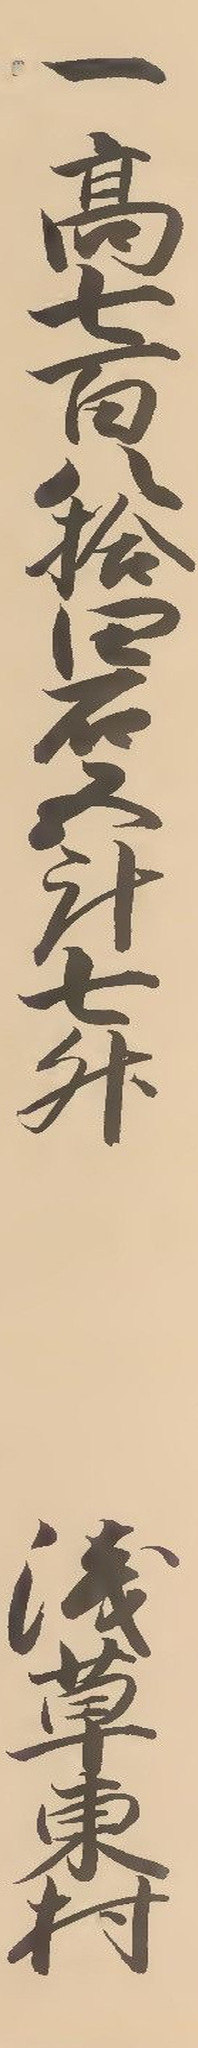一高七百八拾四石五斗七升浅草東村
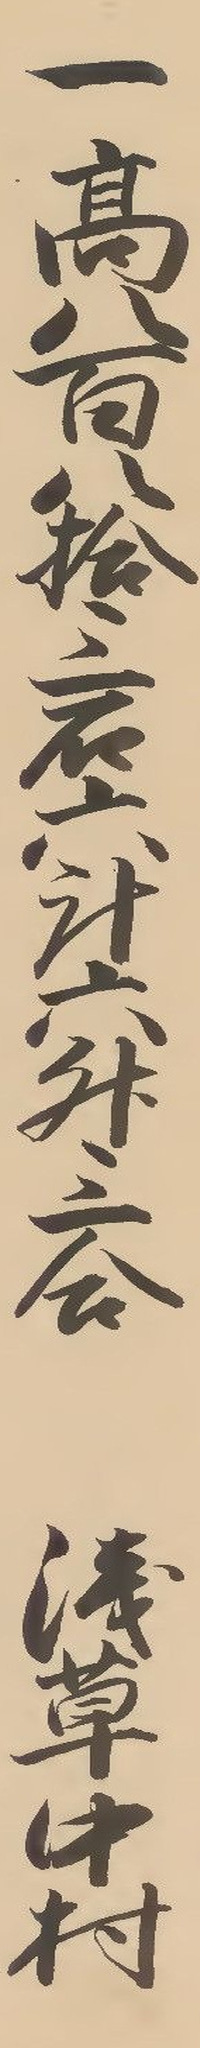一高八百八拾三石六斗六升三合浅草中村
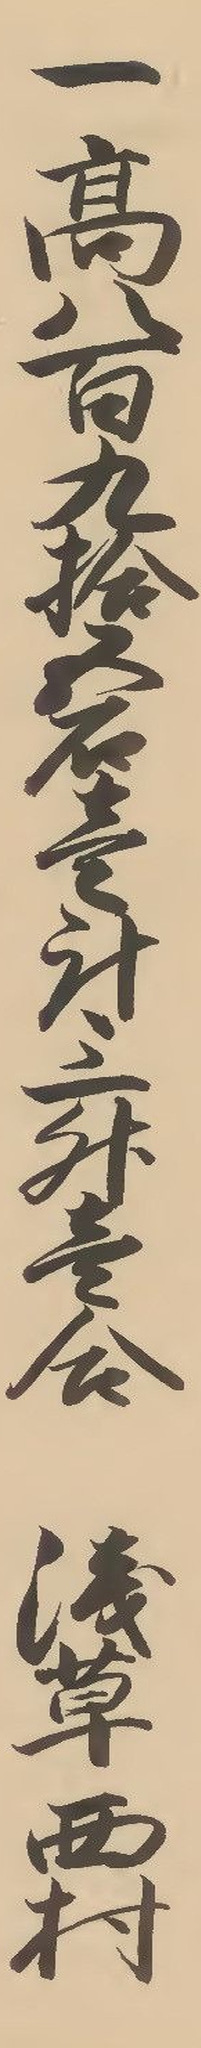一高八百九拾五石壱斗三升壱合浅草西村

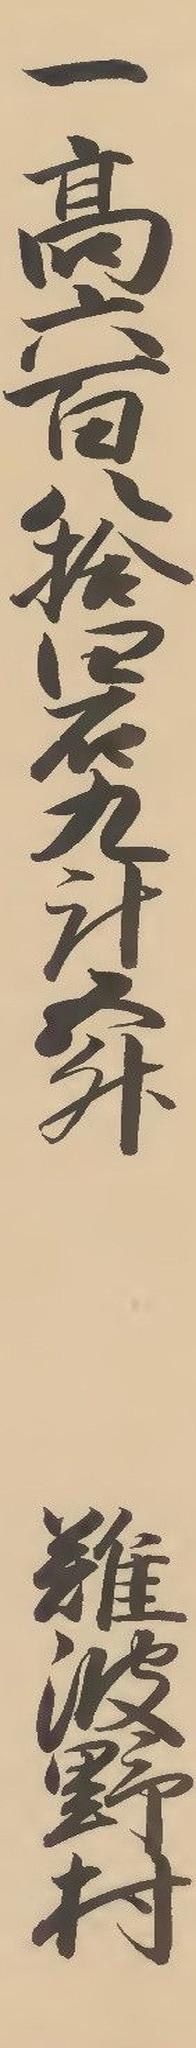一高六百八拾四石九斗五升難波野村
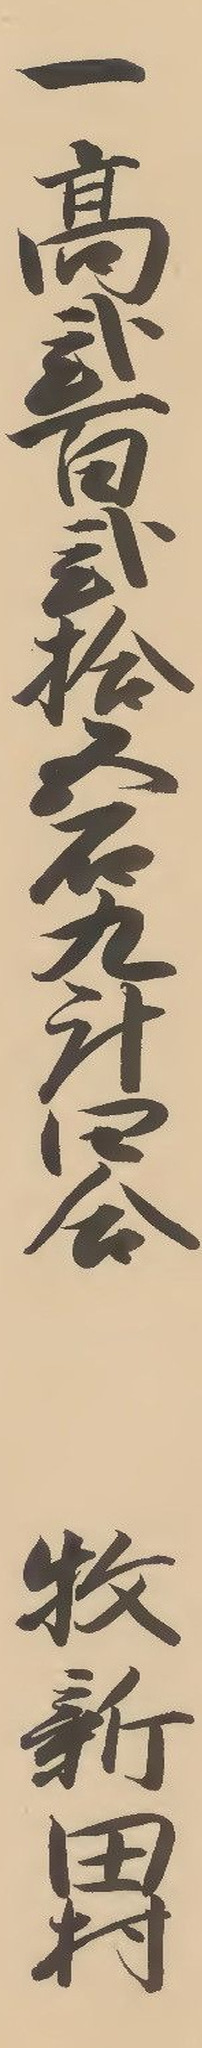一高弐百弐拾五石九斗四合牧新田村
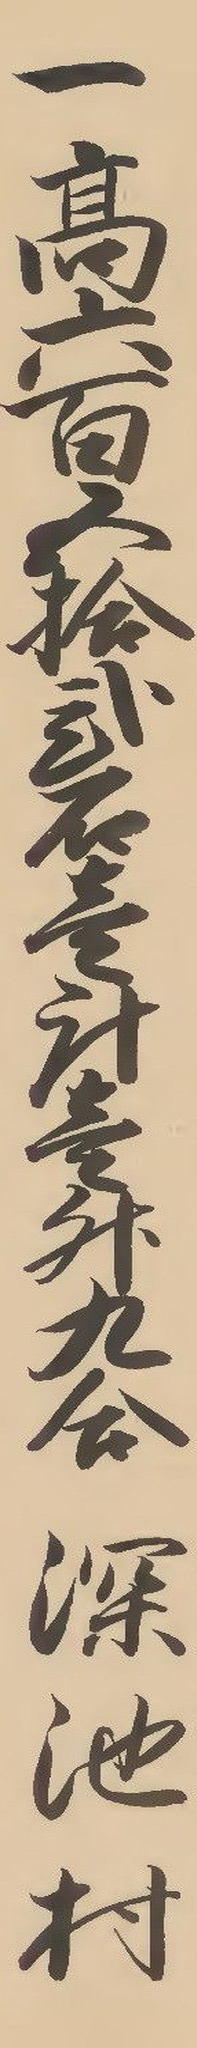一高六百五拾弐石壱斗壱升九合深池村
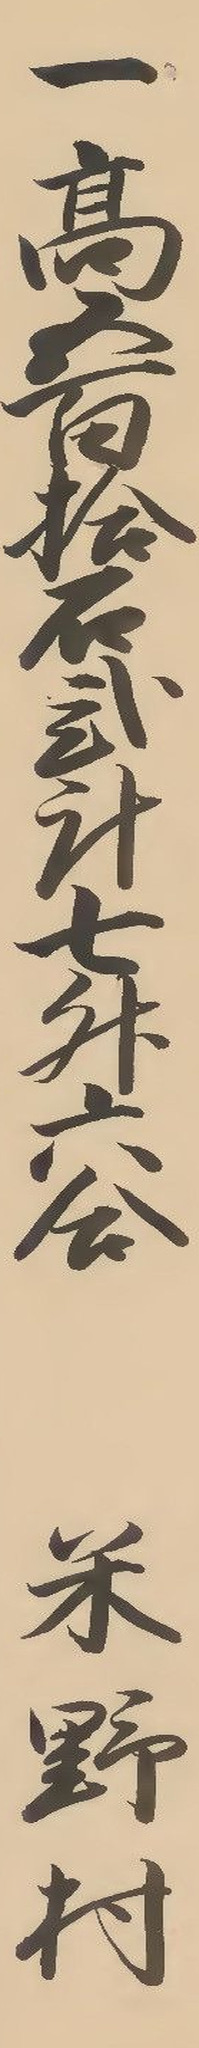一高五百拾石弐斗七升六合米野村
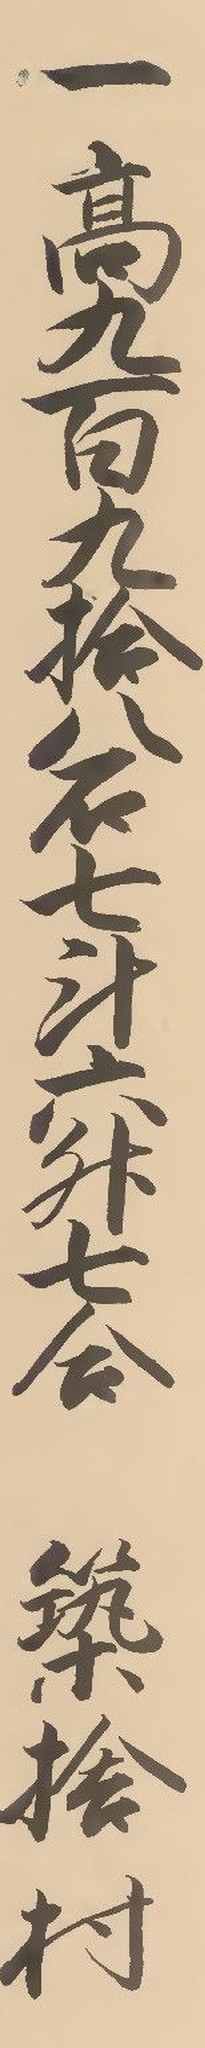一高九百九拾八石七斗六升七合築捨村
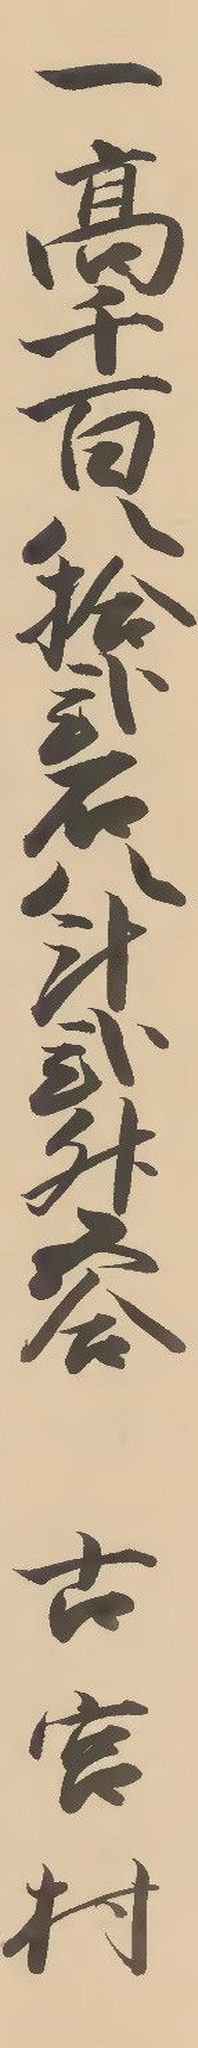一高千百八拾弐石八斗弐升五合古宮村
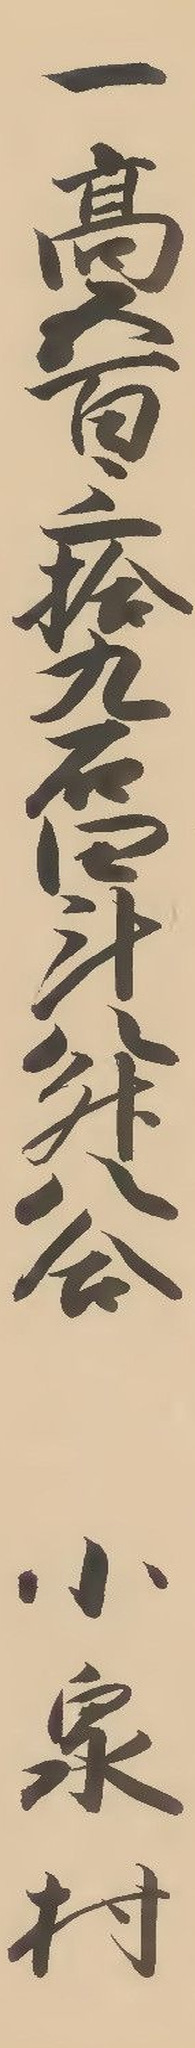一高五百三拾九石四斗八升八合小泉村
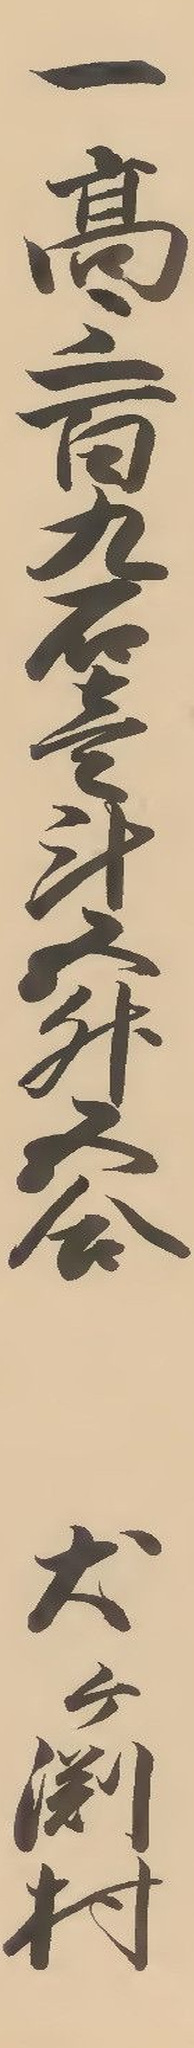一高三百九石壱斗五升五合犬ヶ渕村

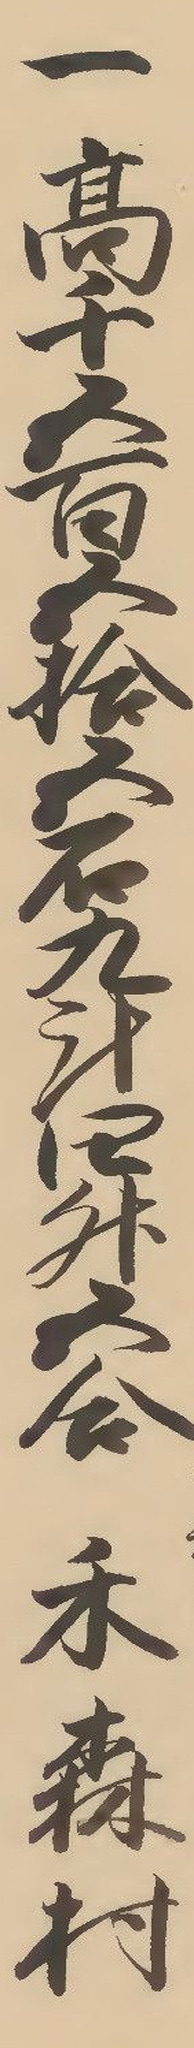一高千四百弐拾三石九斗四升五合木戸村
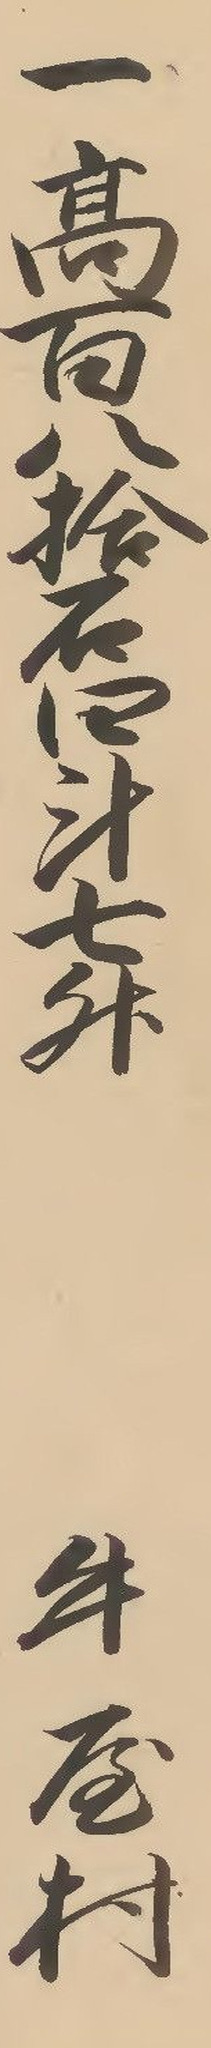一高百八拾石四斗七升牛屋村
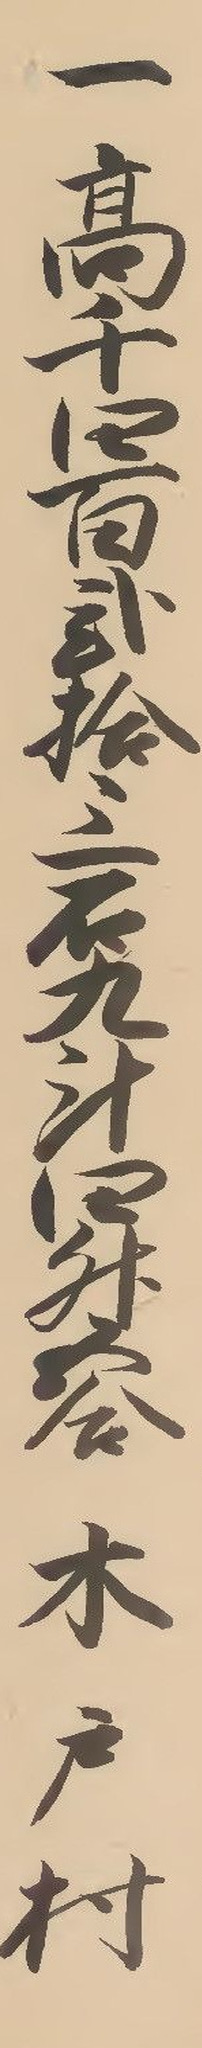一高千四百弐拾三石九斗四升五合木戸村
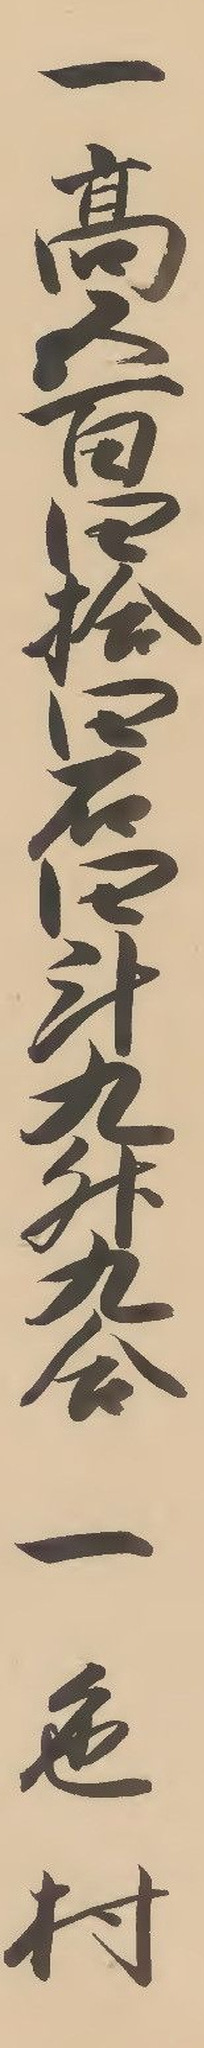一高五百四拾四石四斗九升九合一色村
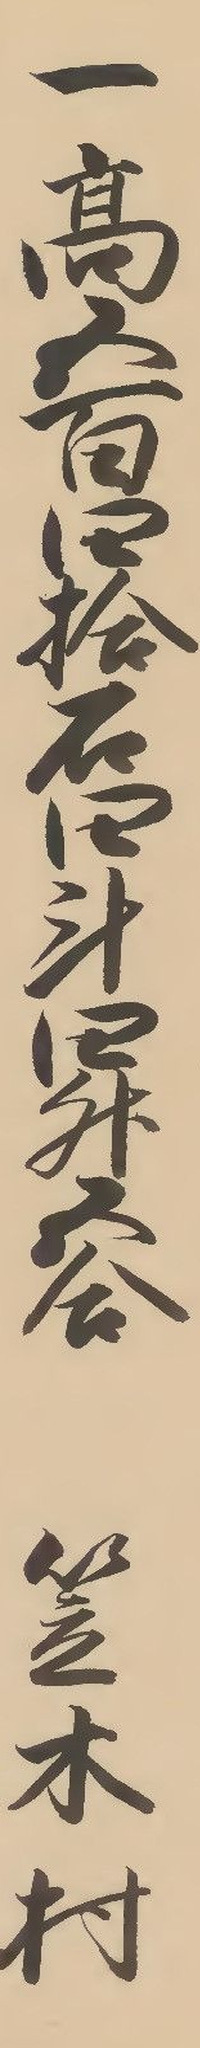一高五百四拾石四斗四升五合笠木村
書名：美濃国郷帳
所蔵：国立公文書館 National Archives of Japan
